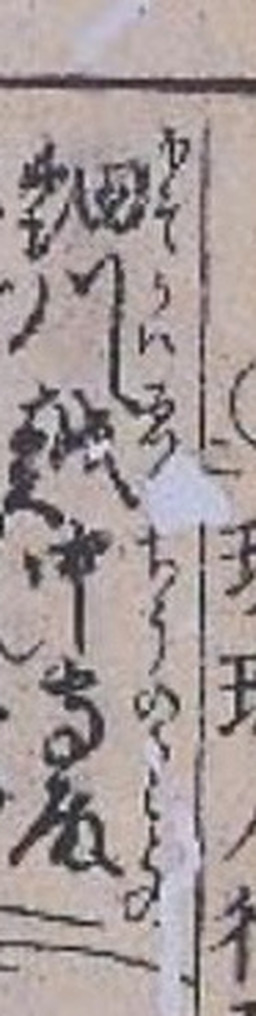細川越中守殿
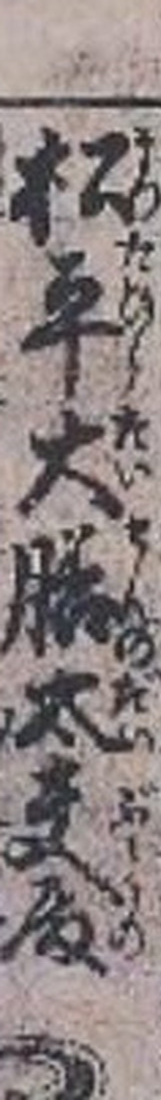松平大膳太夫殿
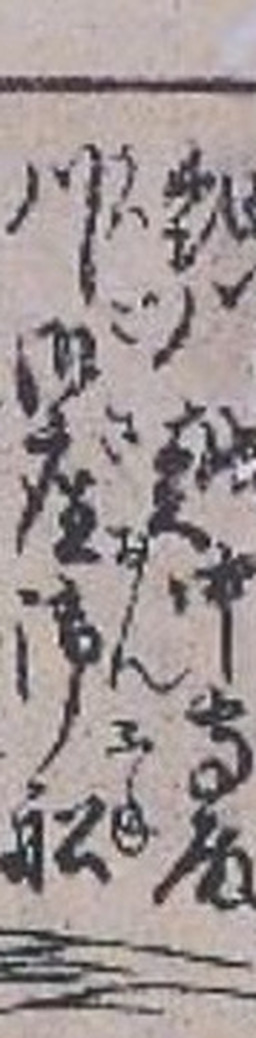川御座御船
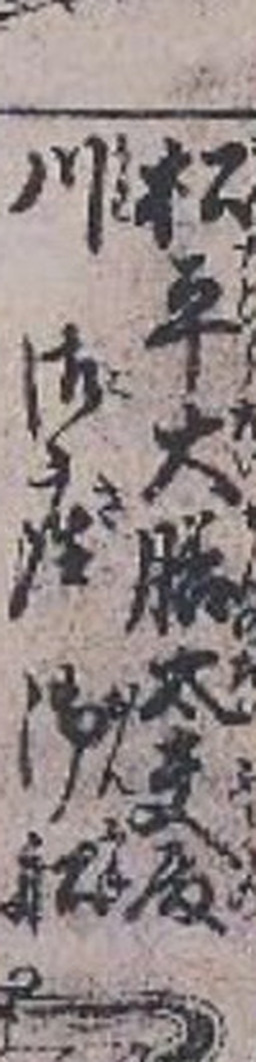川御座御船
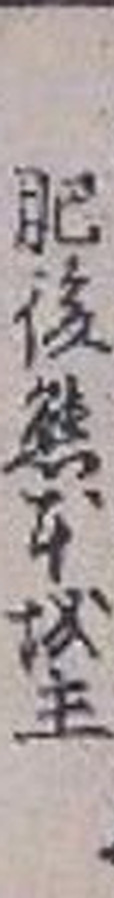肥後熊本城主
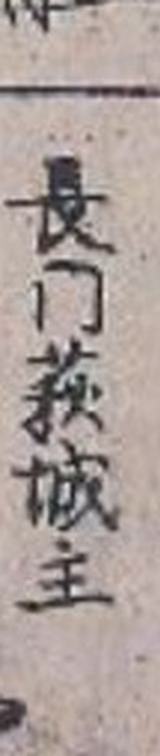長門萩城主
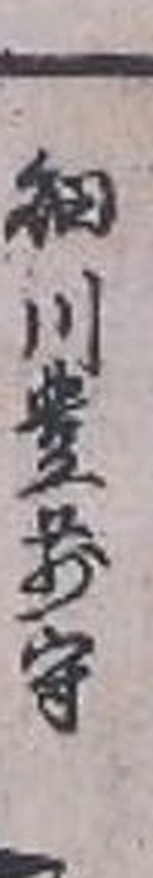細川豊前守
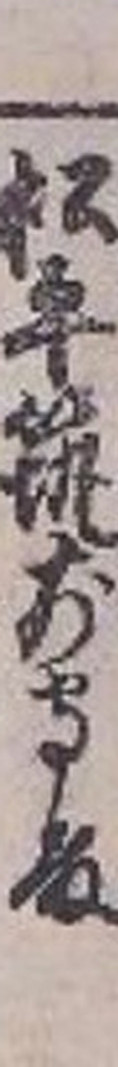松平筑前守殿
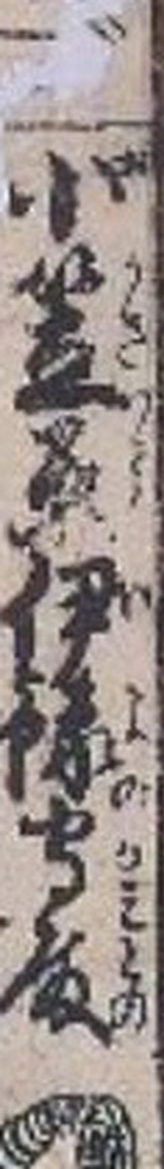小笠原伊豫守殿
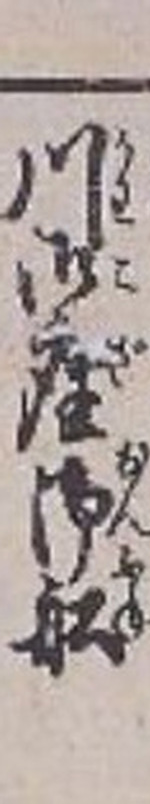川御座御船
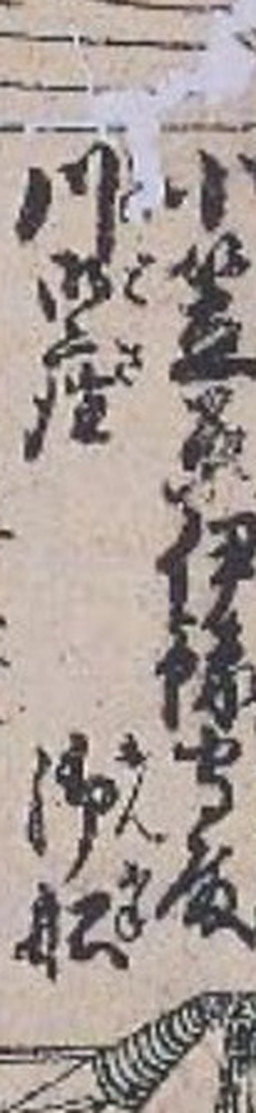川御座御船
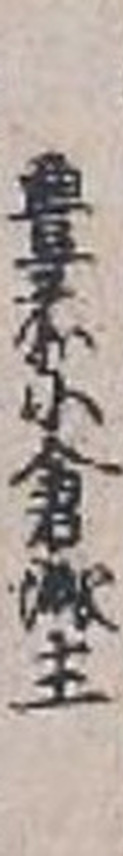豊前小倉城主
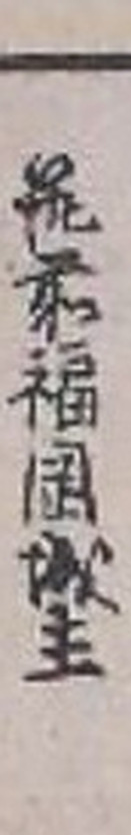筑前福岡城主

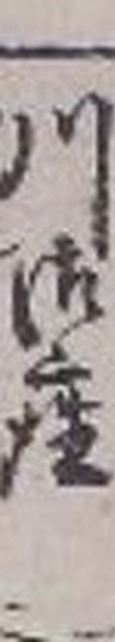川御座
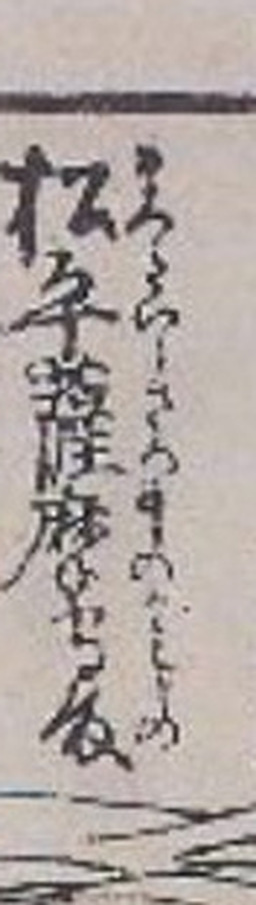松平薩摩守殿
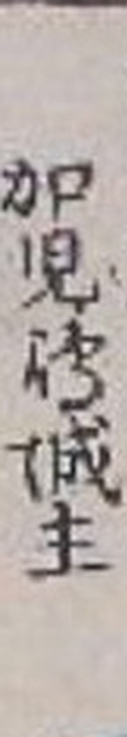加児嶋城主
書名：琉球人大行列記 来朝新板絵入
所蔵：University of the Ryukyus Library
